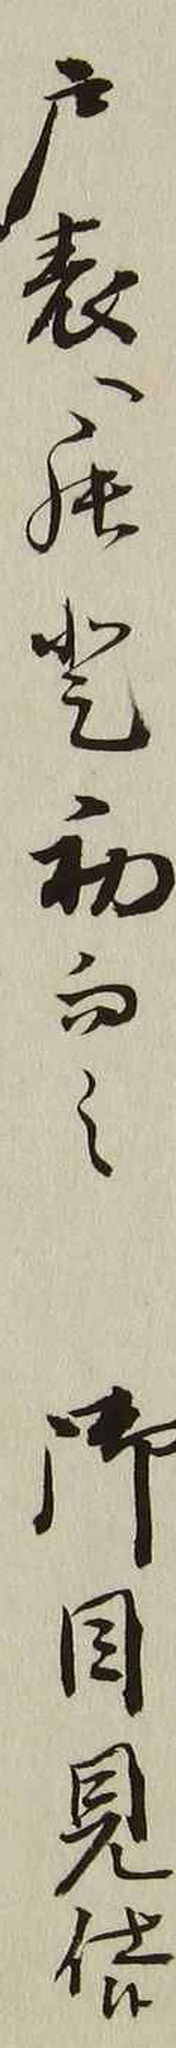戸表へ罷り登り初めて之御目見候
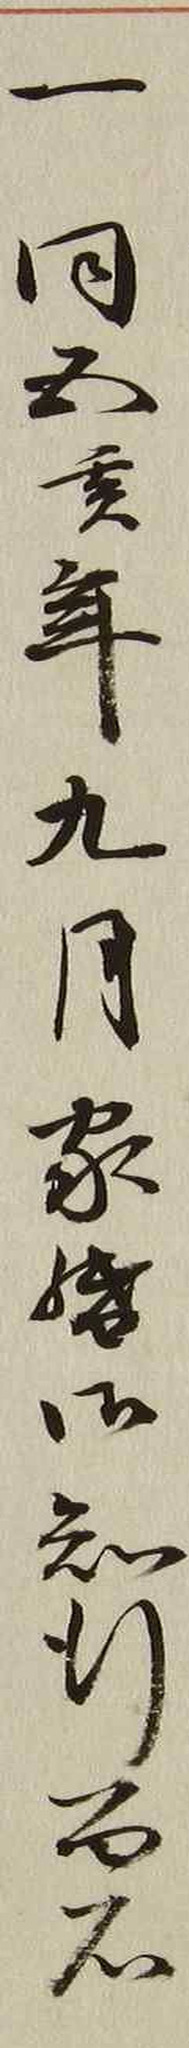一同五亥年九月家督御知行百石
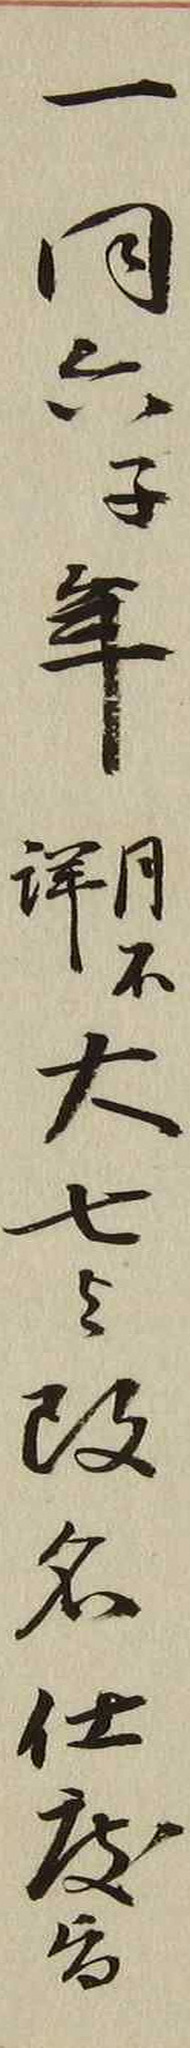一同六子年月不詳大七と改名仕り度旨
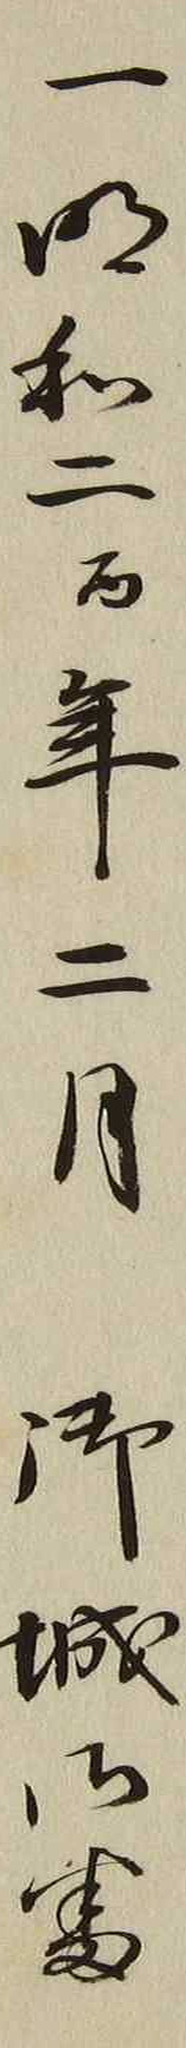一明和二酉年二月御城御番
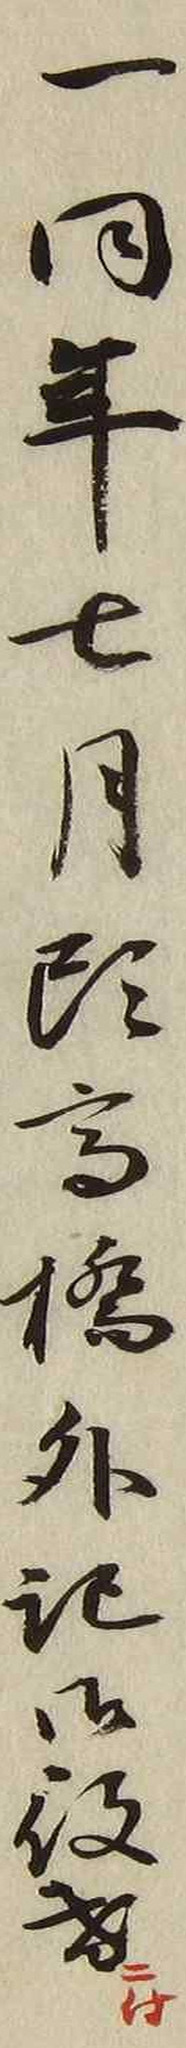一同年七月頭高橋外記御役義ニ付き
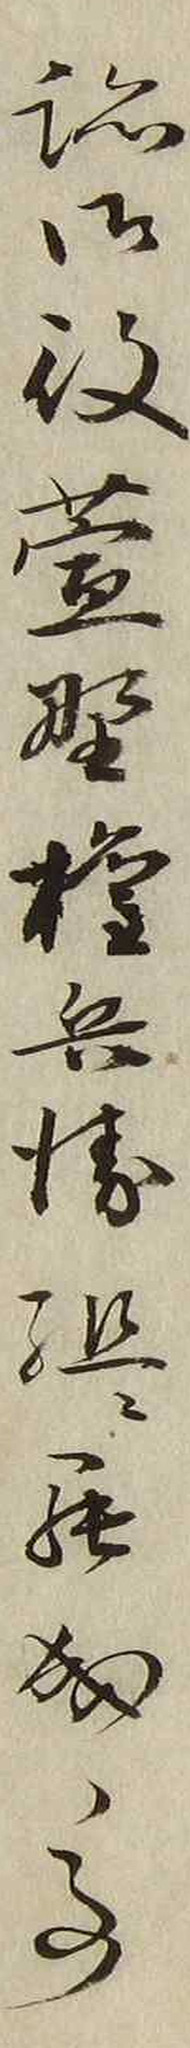諸御役萱野権兵衛組ニ罷り成り候事
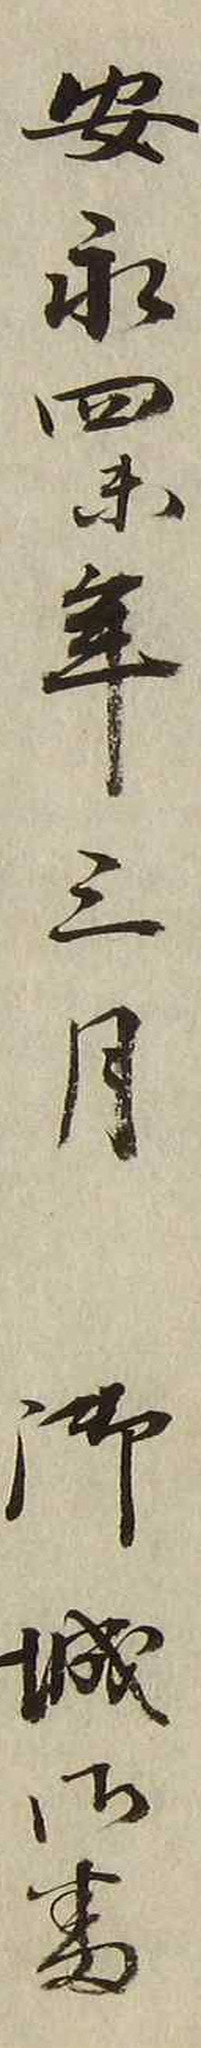一安永四未年三月御城御番
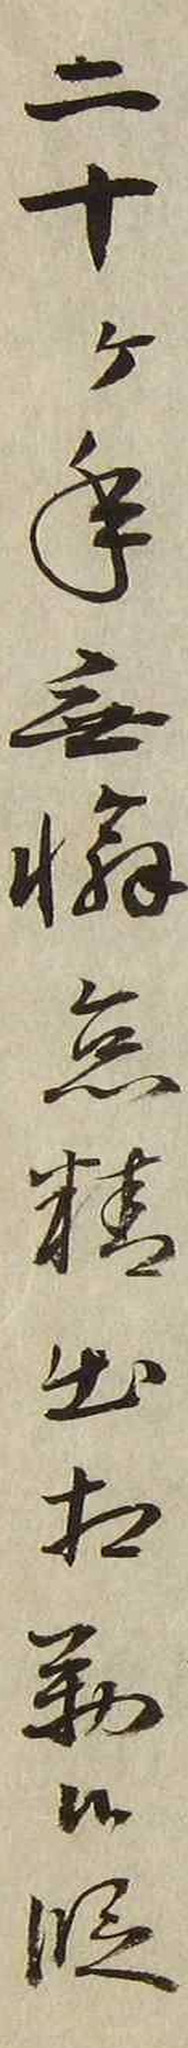二十ケ年懈怠無く精出し相勤候段

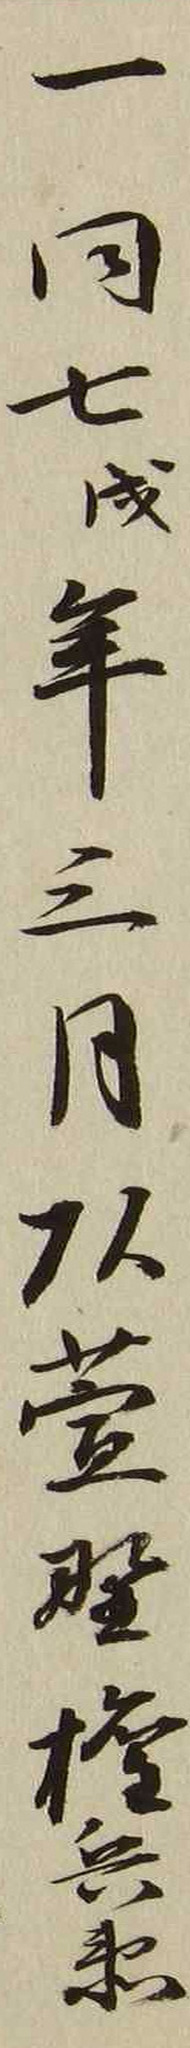一同七戌年三月頭萱野権兵衛
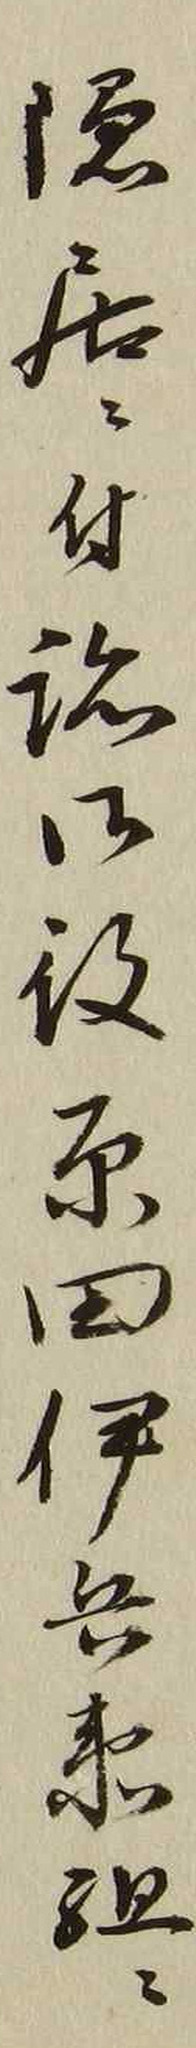隠居ニ付き諸御役原田伊兵衛組ニ
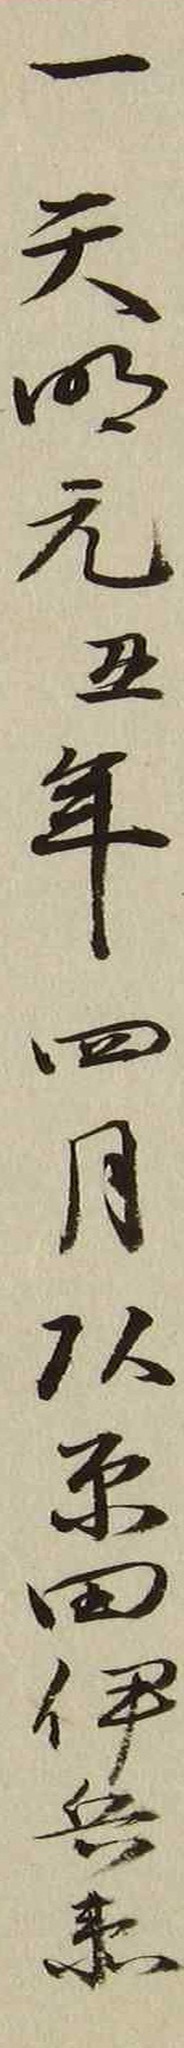一天明元丑年四月頭原田伊兵衛
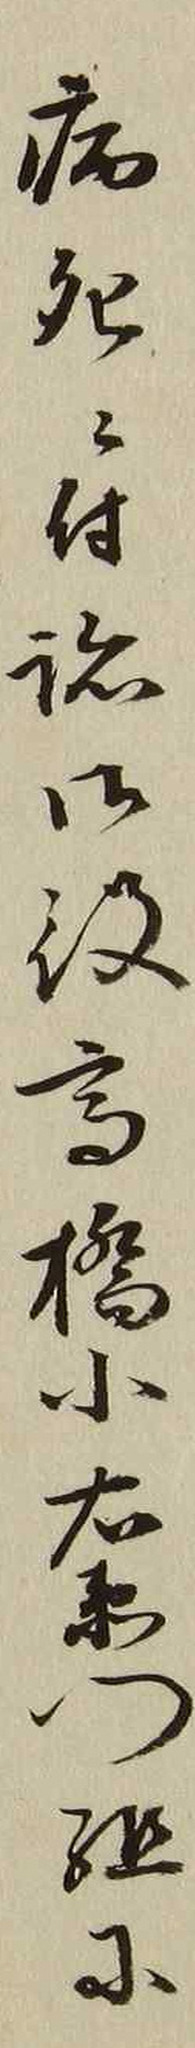病死ニ付き諸御役高橋小右衛門組に
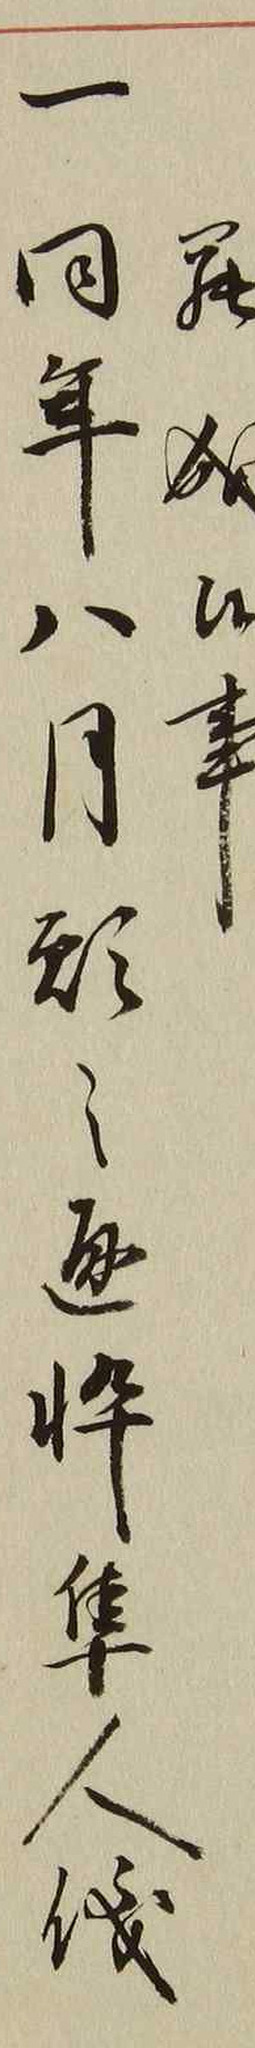一同年八月願之通り倅隼人儀
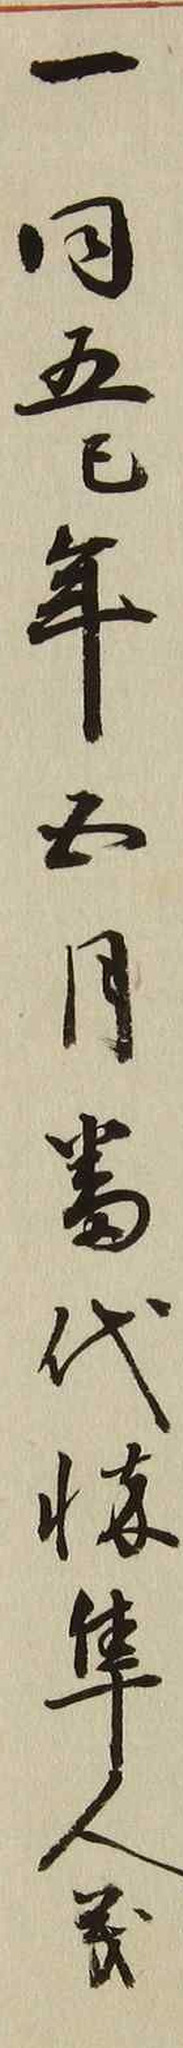一同五巳年五月番代倅隼人義
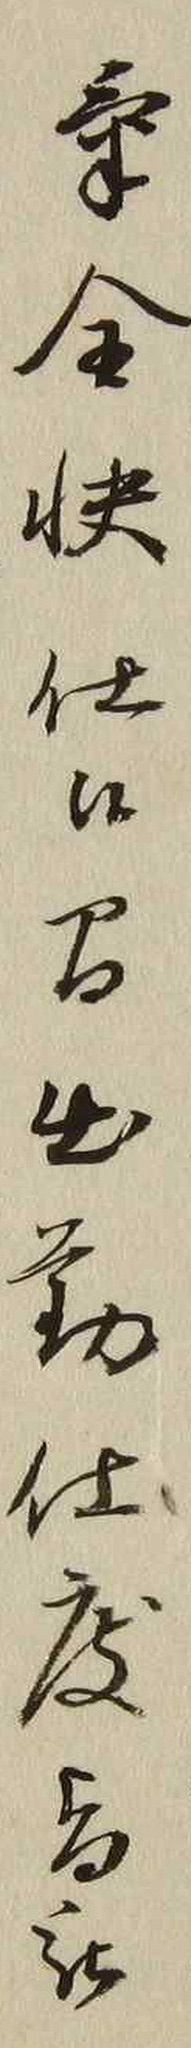気全快仕り候間出精仕り度旨
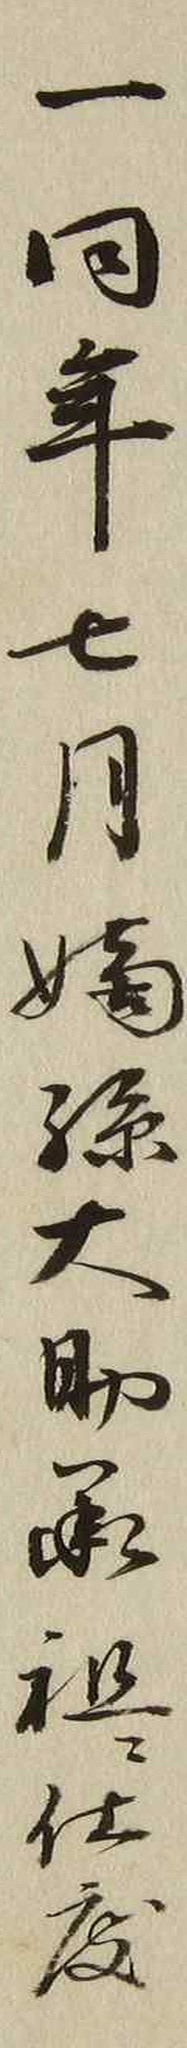一同年七月嫡孫大助承祖ニ仕り度
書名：諸士系譜　巻之19　い之部19
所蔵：会津若松市立会津図書館
